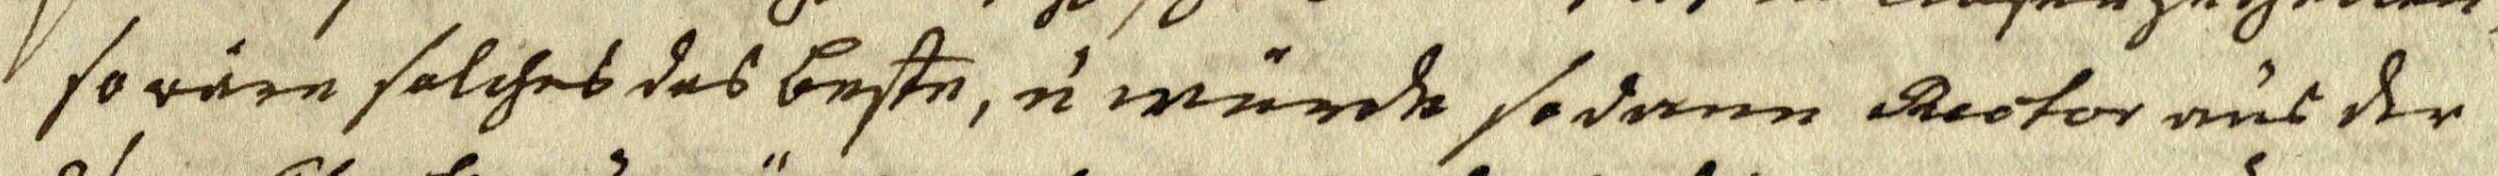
so wäre solches das Beste, u würde sodann Rector aus der
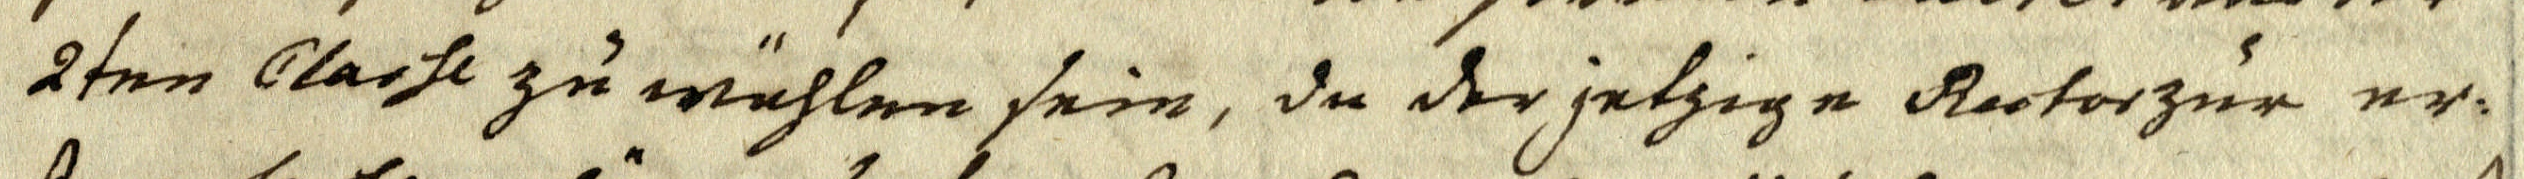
2 ten Classe zu wählen sein, da der jetzige Rector zur er¬
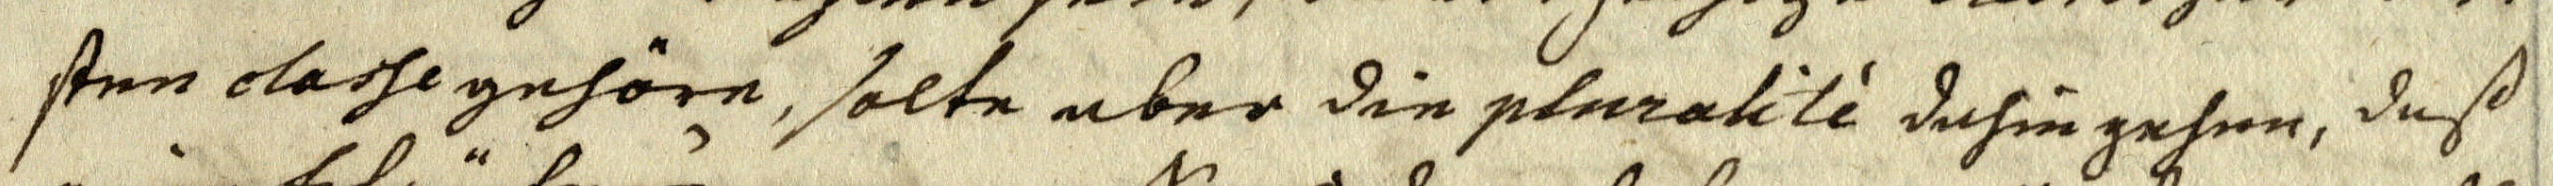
sten classe gehöre, solte aber die pluralité dahin gehen, daß
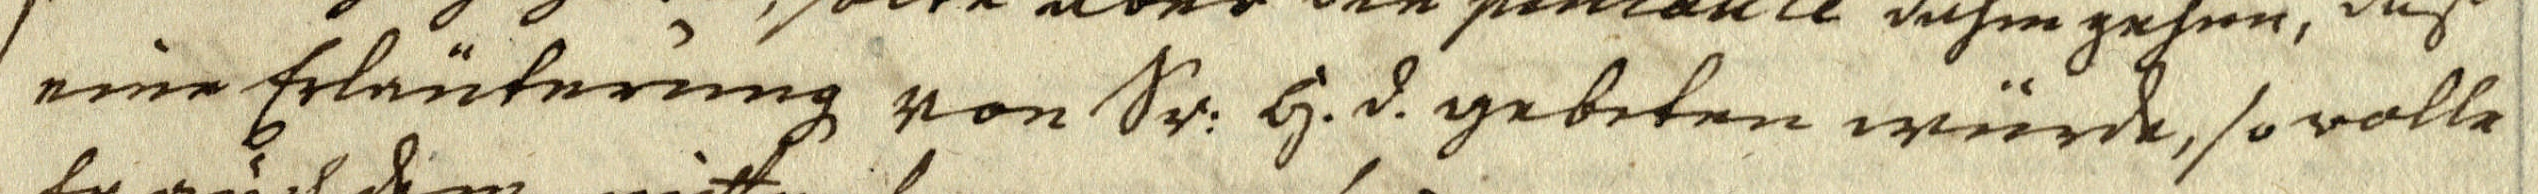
eine Erläuterung von Sr H. d. gebeten würde, so wolle
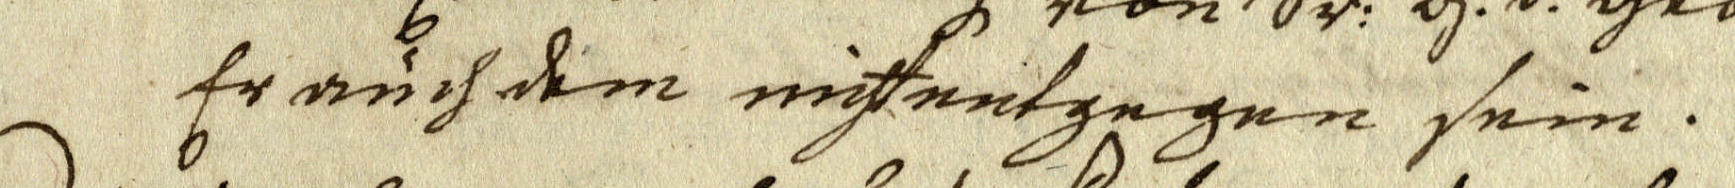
Er auch dem nicht entgegen sein.
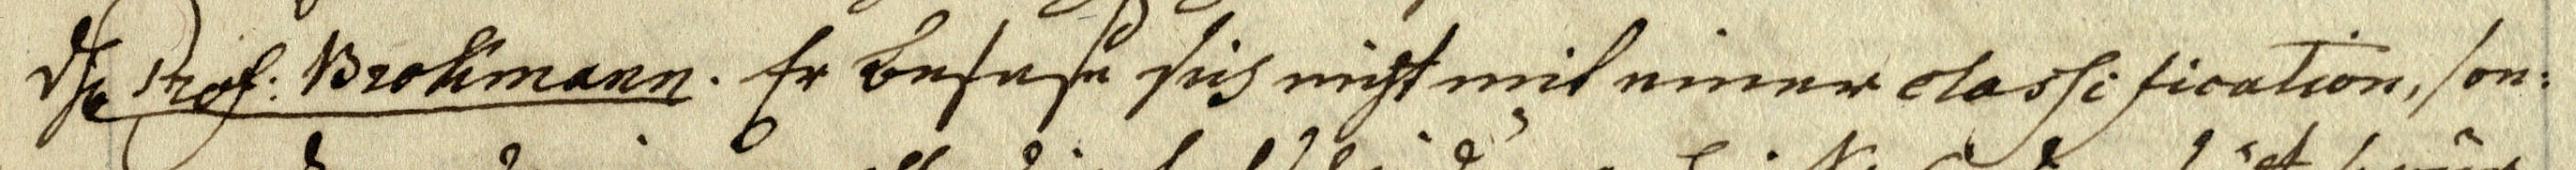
dh. Prof. Brockmann. Er befaße sich nicht mit einer classification, son¬
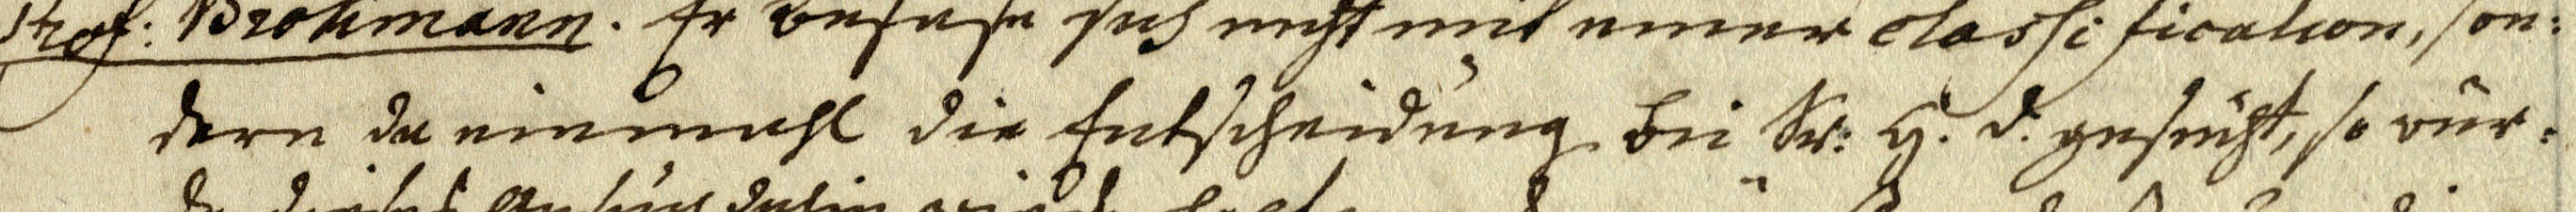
dern da einmahl die Entscheidung bei Sr H. d. gesucht, so wür¬
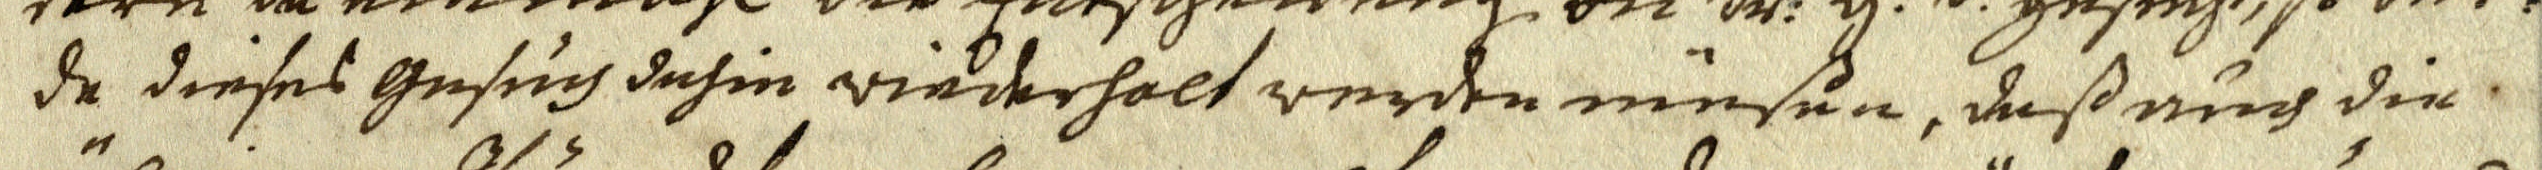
de dieses Gesuch dahin wiederholt werden müßen, daß auch die
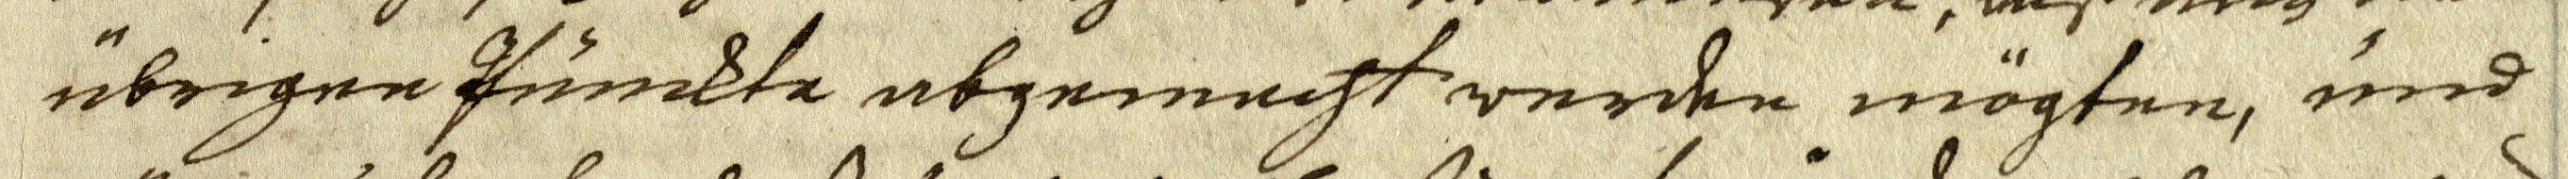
übrigen Punckte abgemacht werden mögten, und
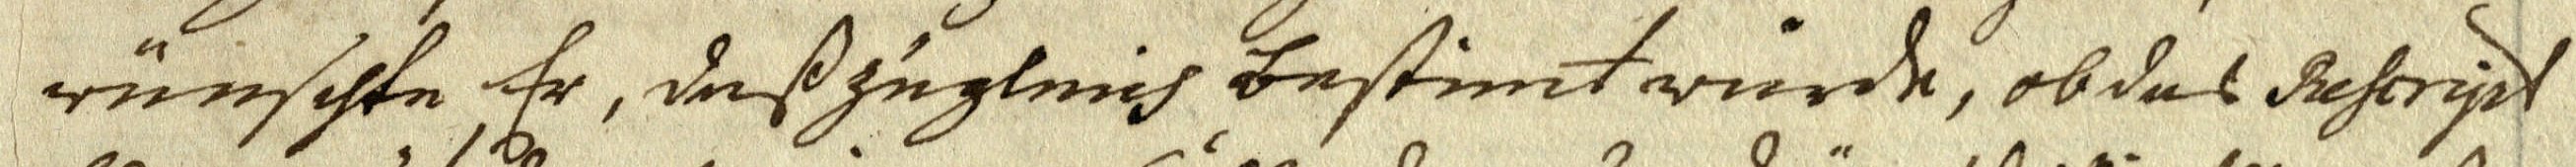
wünschte Er, daß zugleich bestimt würde, ob das Rescript
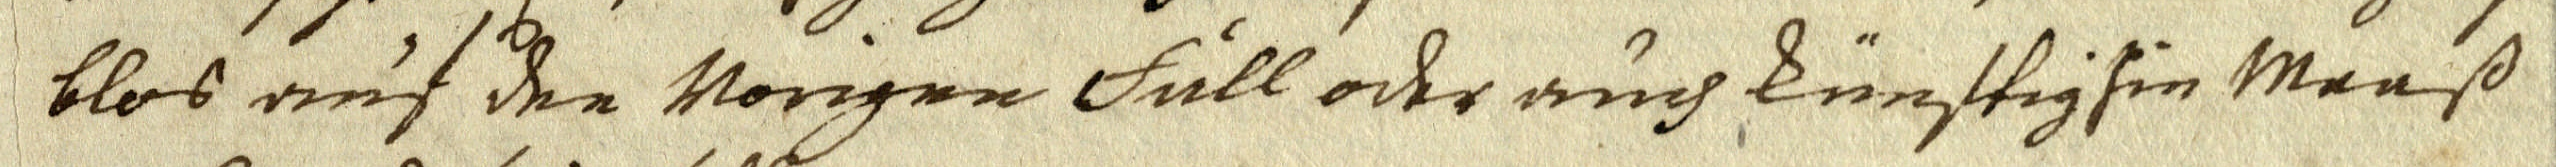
blos auf den vorigen Fall oder auch künftig hin Maaß
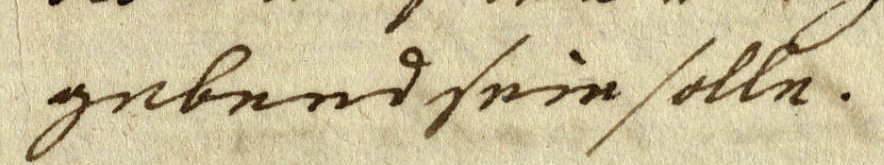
gebend sein solle.
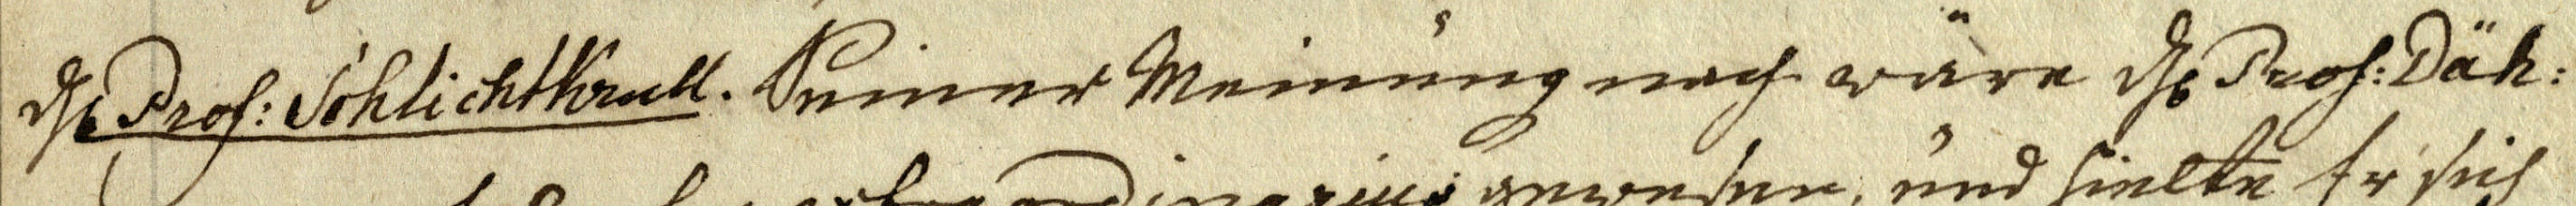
dh. Prof. Schlichtkrull. Seiner Meinung nach wäre dh. Prof. Däh¬
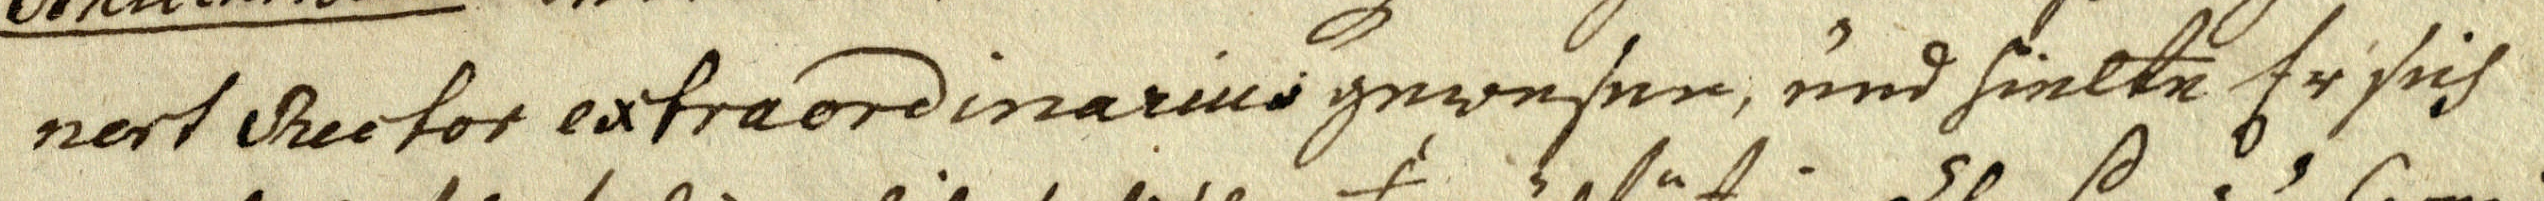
nert Rector extraordinarius gewesen und hielte Er sich
